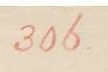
Signore
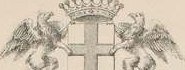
Sigre A. Escher
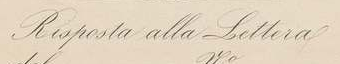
Risposta alla Lettera
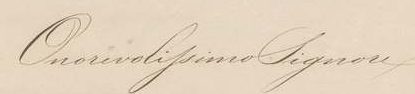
Onorevolissimo Signore
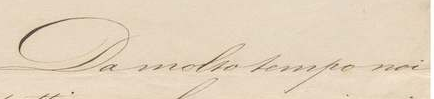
Da molto tempo noi
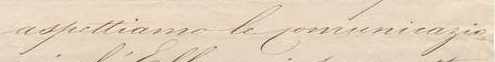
aspettiamo le comunicazio-
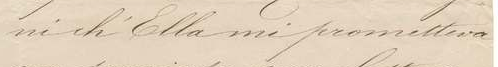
ni ch'Ella mi prometteva
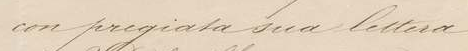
con pregiata sua lettera
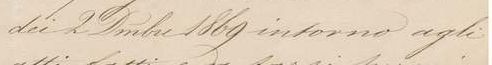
dei 2 Dicembre 1869 intorno agli
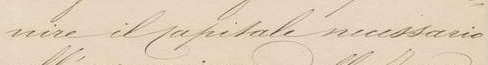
nire il capitale necessario
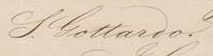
S. Gottardo.
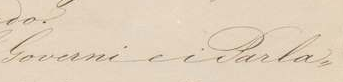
Governi e i Parla-
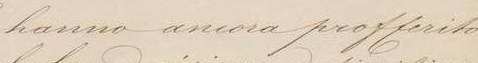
hanno ancora profferito
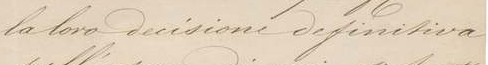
la loro decisione definitiva
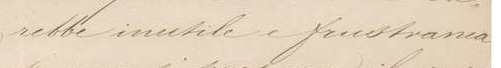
rebbe inutile e frustranea
